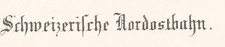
Schweizerische Nordostbahn.
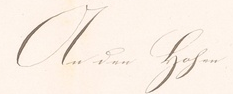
An den Hohen
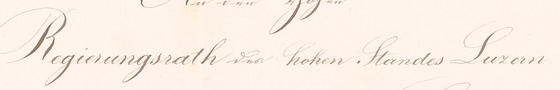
Regierungsrath des hohen Standes Luzern
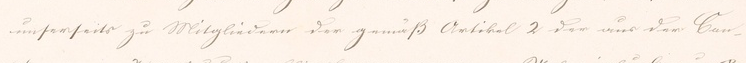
unserseits zu Mitgliedern der gemäß Artikel 2 der aus der Con-
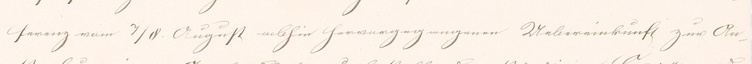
ferenz vom 7./8. August abhin hervorgegangenen Uebereinkunft zur An-
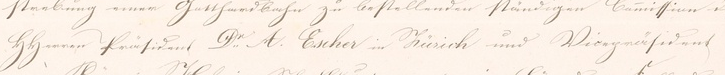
HHerren Präsident Dr A. Escher in Zürich und Vizepräsident
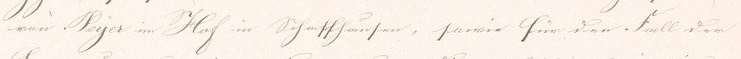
von Peyer im Hof in Schaffhausen, sowie für den Fall der
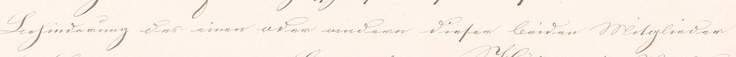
Behinderung des einen oder andern dieser beiden Mitglieder
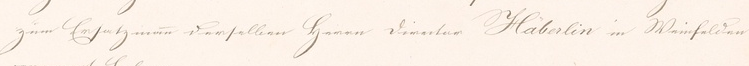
zum Ersatzmann derselben Herrn Director Häberlin in Weinfelden
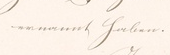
ernannt haben.
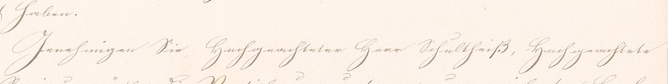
Genehmigen Sie, Hochgeachteter Herr Schultheiß, Hochgeachtete
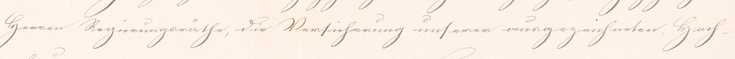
Herren Regierungsräthe, die Versicherung unserer ausgezeichneten Hoch-
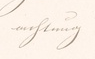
achtung
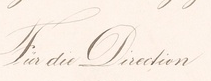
Für die Direction
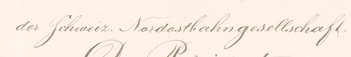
der Schweiz. Nordostbahngesellschaft,
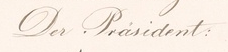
Der Präsident:
